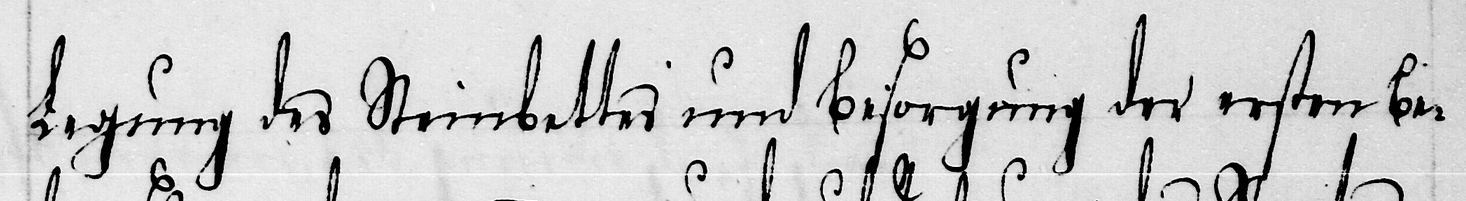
Legung des Steinbettes und Besorgung der ersten Be¬
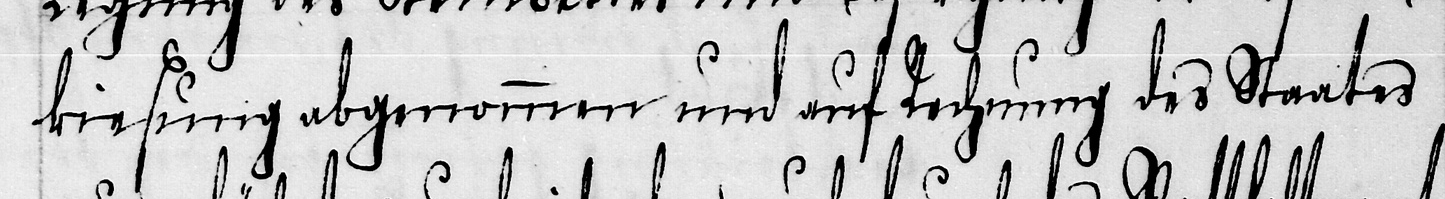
kiesung abgenommen und auf Rechnung des Staates
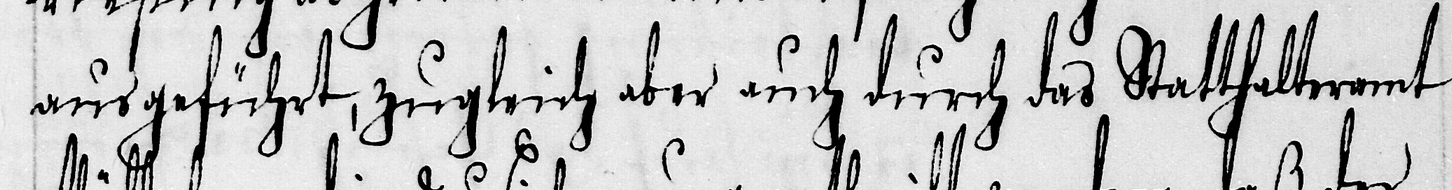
ausgeführt, zugleich aber auch durch das Statthalteramt
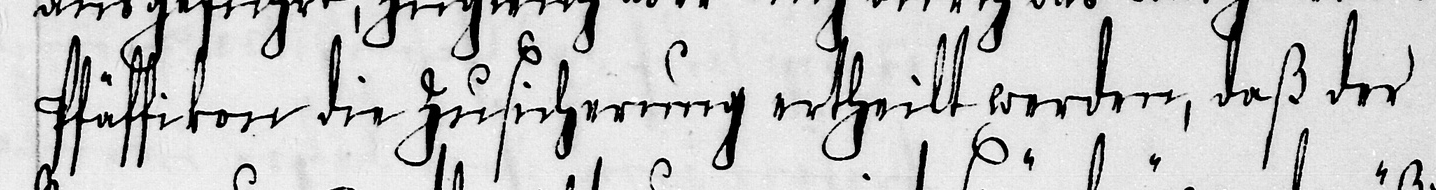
Pfäffikon die Zusicherung ertheilt werden, daß der
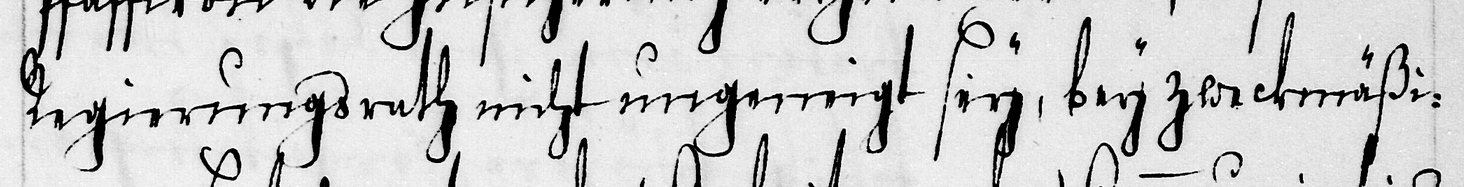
Regierungsrath nicht ungeneigt sey, bey zweckmäßi¬
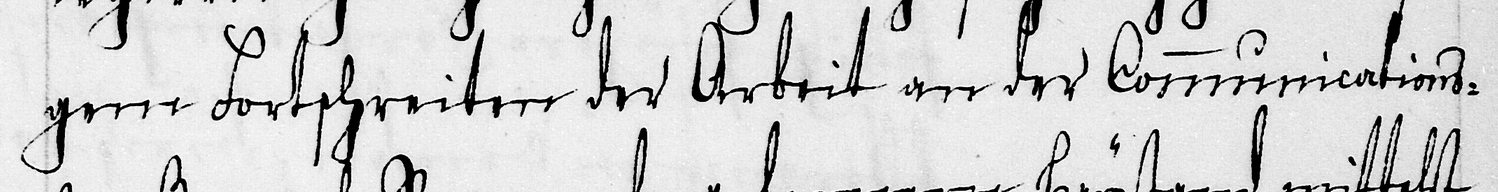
gem Fortschreiten der Arbeit an der Communications¬
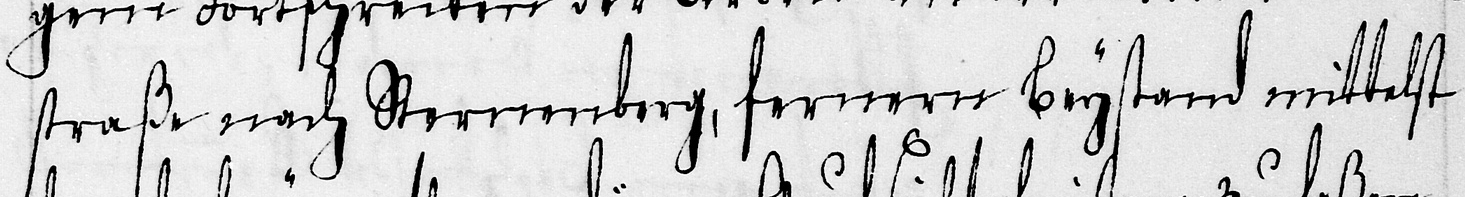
straße nach Sternenberg, fernern Beystand mittelst
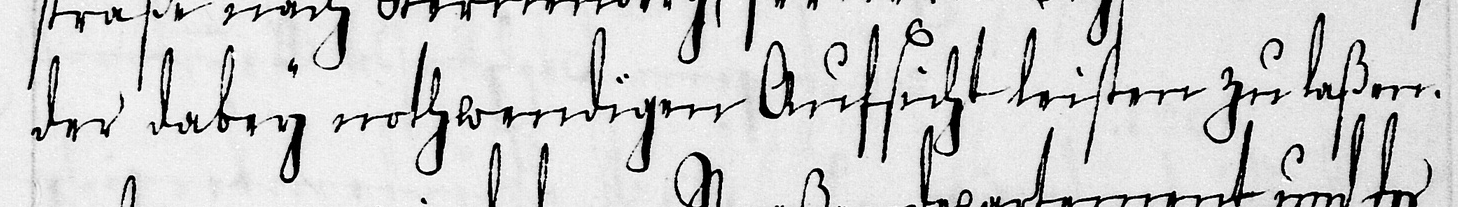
der dabey nothwendigen Aufsicht leisten zu laßen.
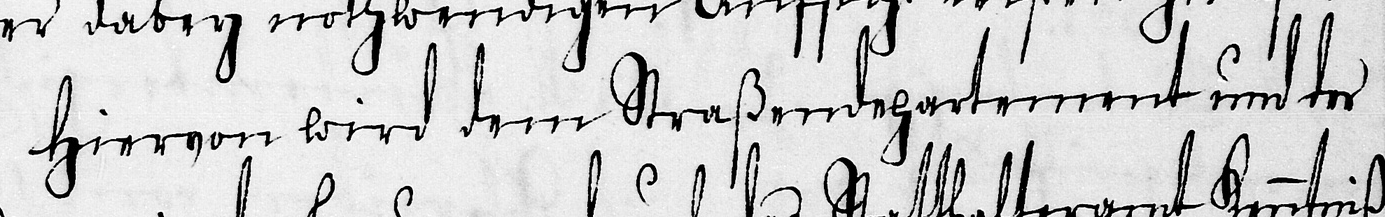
Hiervon wird dem Straßendepartement und der
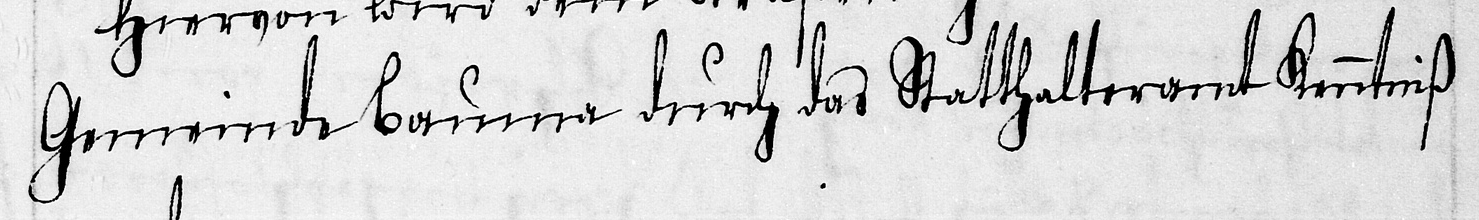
Gemeinde Bauma durch das Statthalteramt Kenntniß
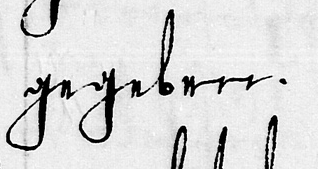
gegeben.
